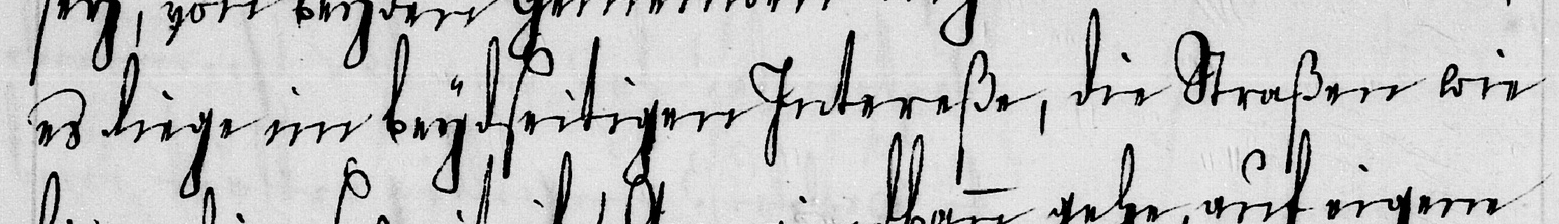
es liege im beydseitigen Intereße, die Straßen wie
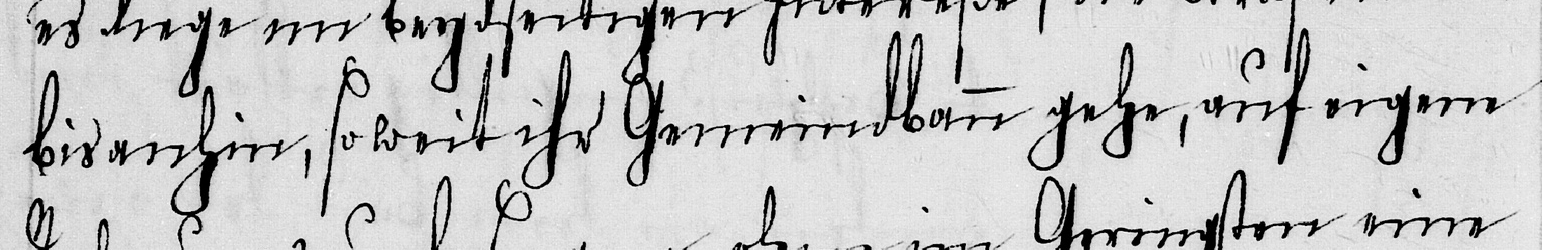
bis anhin, soweit ihr Gemeindbann gehe, auf eigene
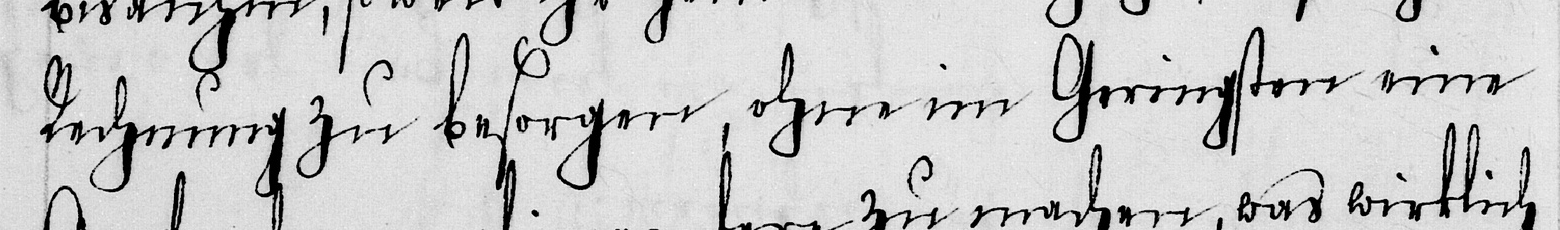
Rechnung zu besorgen, ohne im Geringsten eine
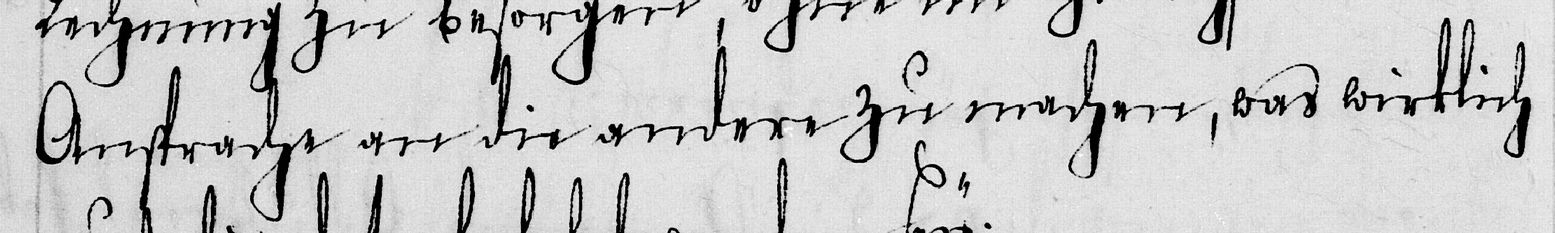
Ansprache an die andere zu machen, was wirklich
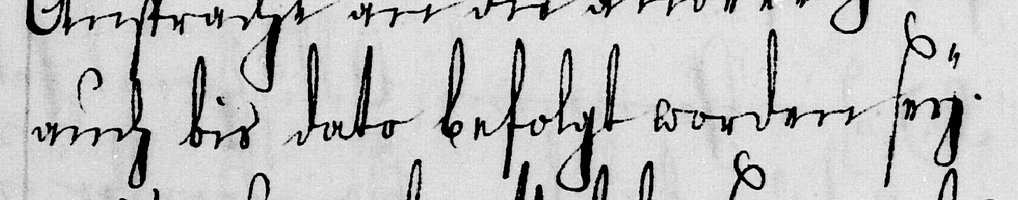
auch bis dato befolgt worden sey.
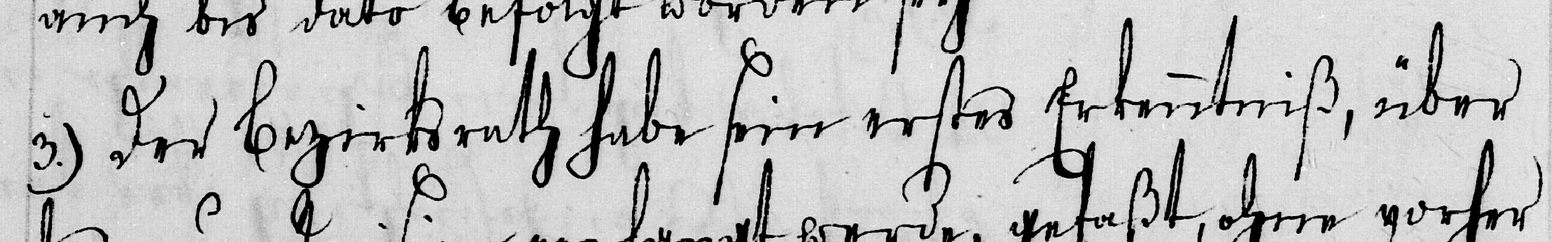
3.) Der Bezirksrath habe sein erstes Erkenntniß, über
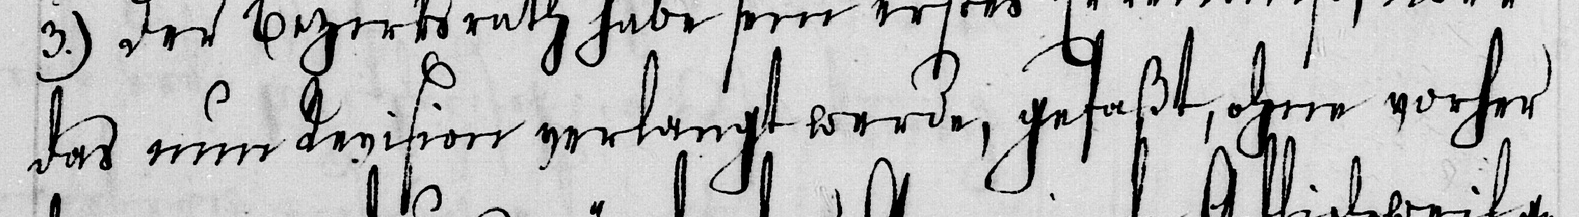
das nun Revision verlangt werde, gefaßt, ohne vorher
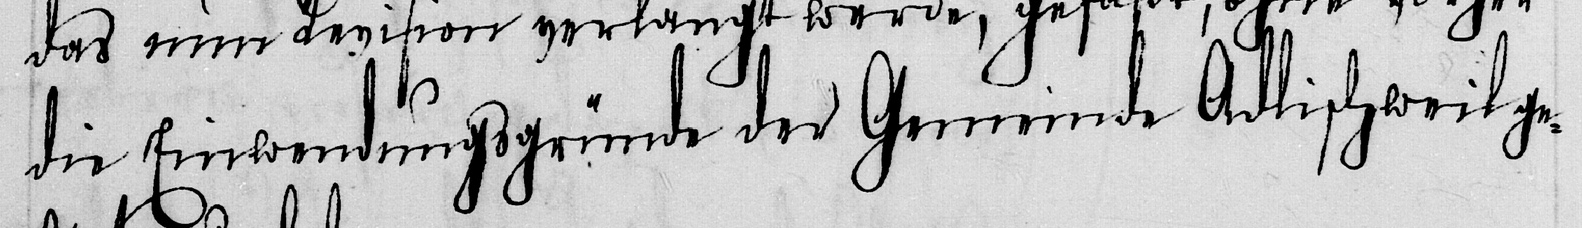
die Einwendungsgründe der Gemeinde Adlischweil g¬
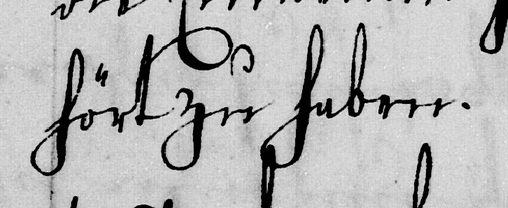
ehört zu haben.
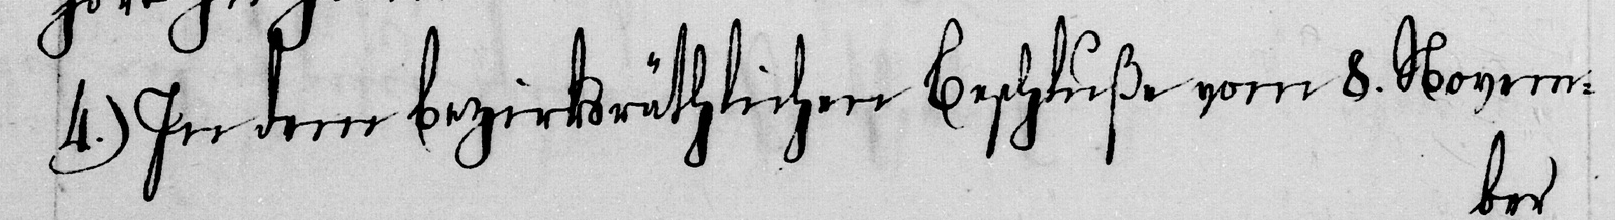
4.) In dem bezirksräthlichen Beschluße vom 8. Novem
